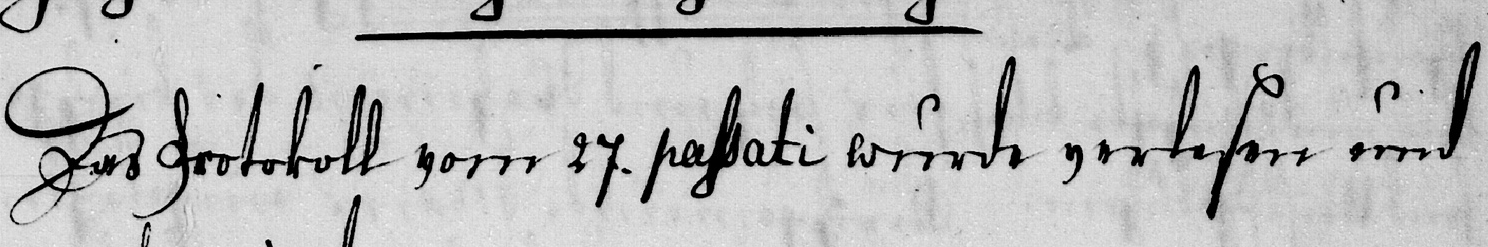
Das Protokoll vom 27. passati wurde verlesen und
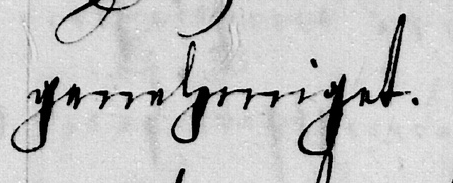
genehmigt.
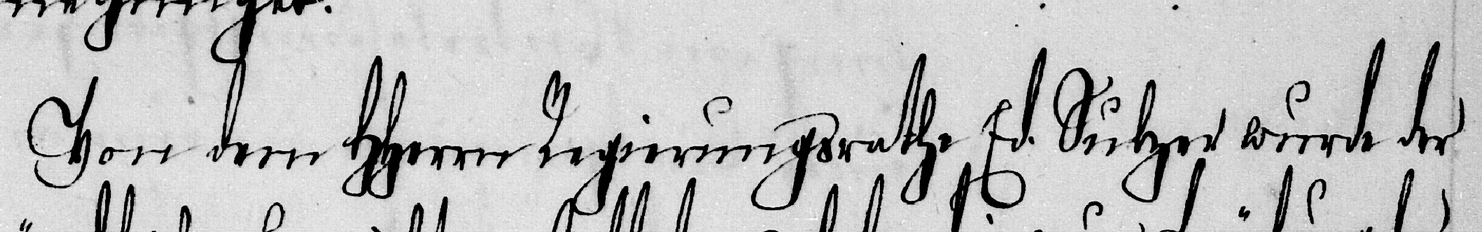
Von dem HHerren Regierungsrathe Ed. Sulzer wurde der
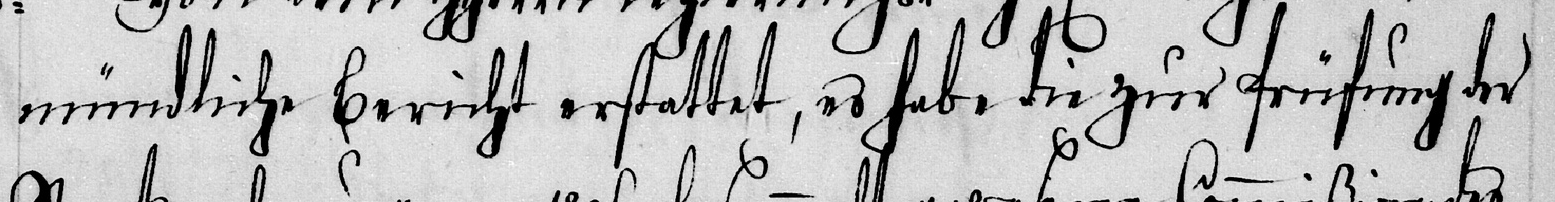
mündliche Bericht erstattet, es habe die zur Prüfung der
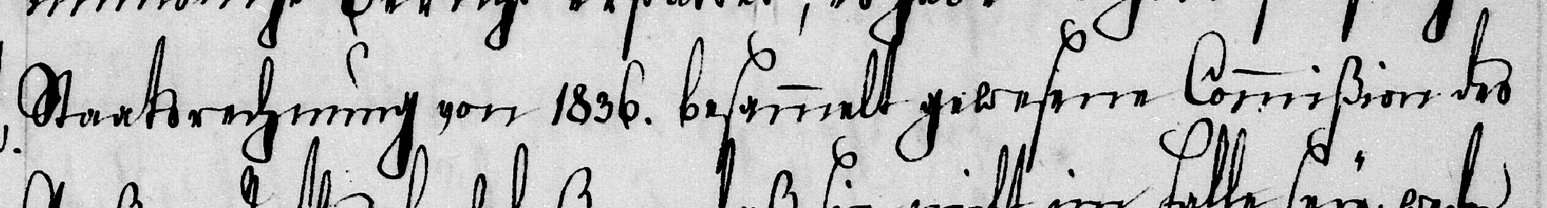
Staatsrechnung von 1836. besammelt gewesene Commißion des
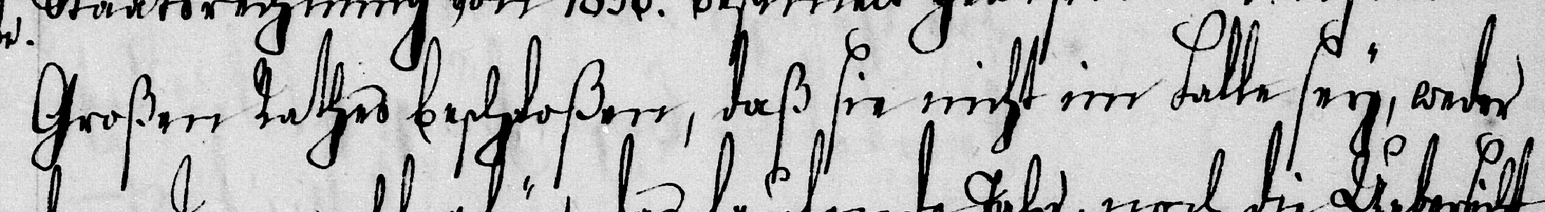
Großen Rathes beschloßen, daß sie nicht im Falle sey, weder
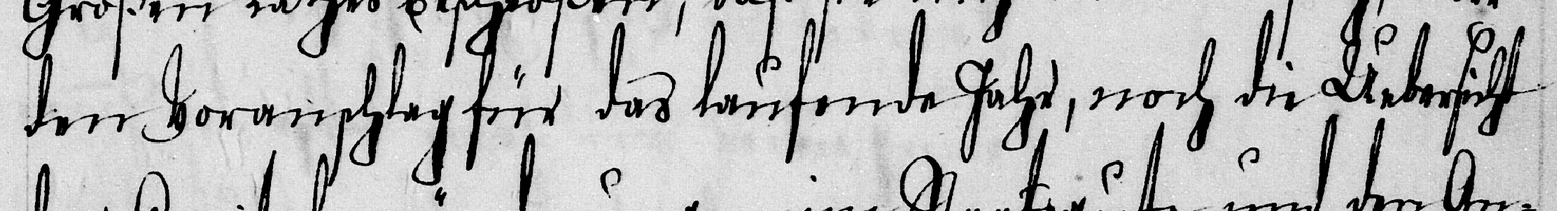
den Voranschlag für das laufende Jahr, noch die Uebersicht
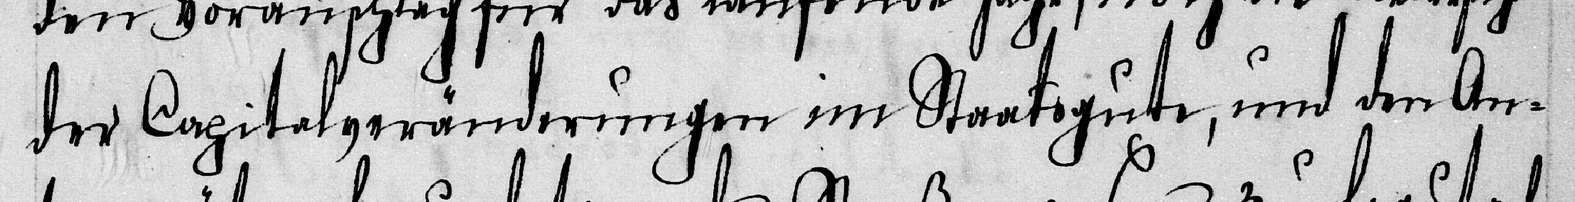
der Capitalveränderungen im Staatsgute, und den An¬
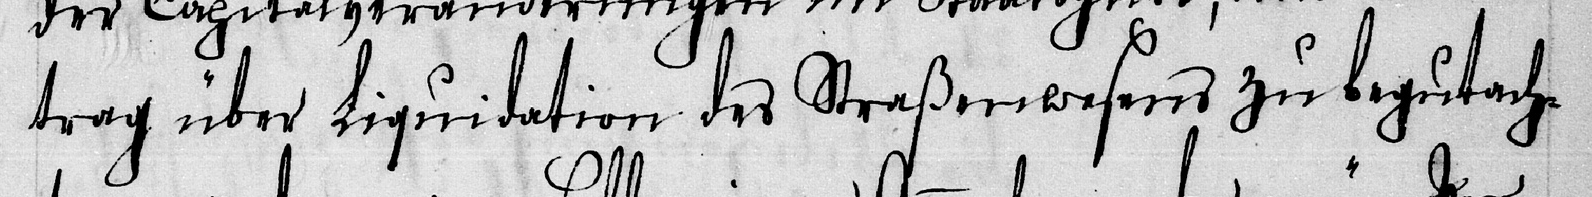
trag über Liquidation des Straßenwesens zu begutach¬
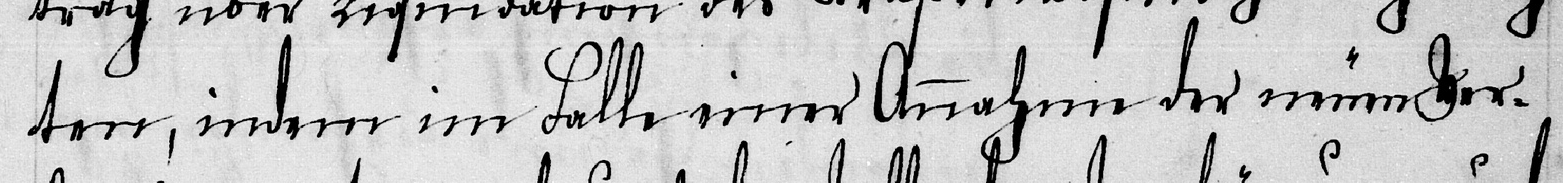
ten, indem im Falle einer Annahme der neuen Ver¬
